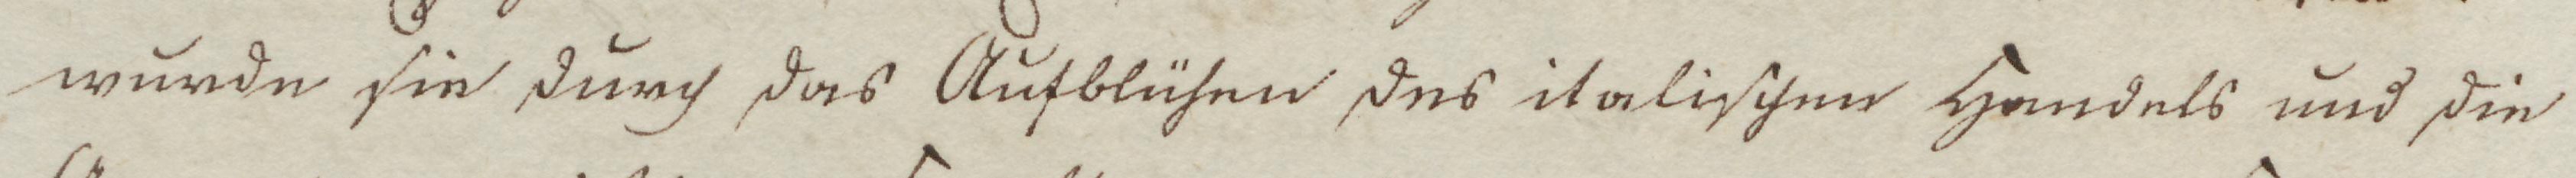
wurde sie durch das Aufblühen des italischen Handels und die
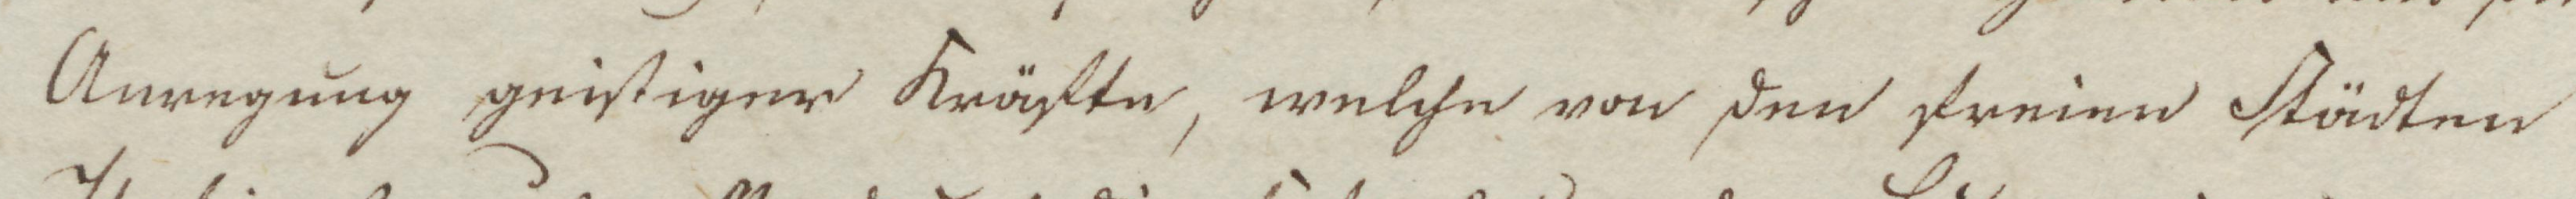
Anregung geistiger Kräfte, welche von den freien Städten
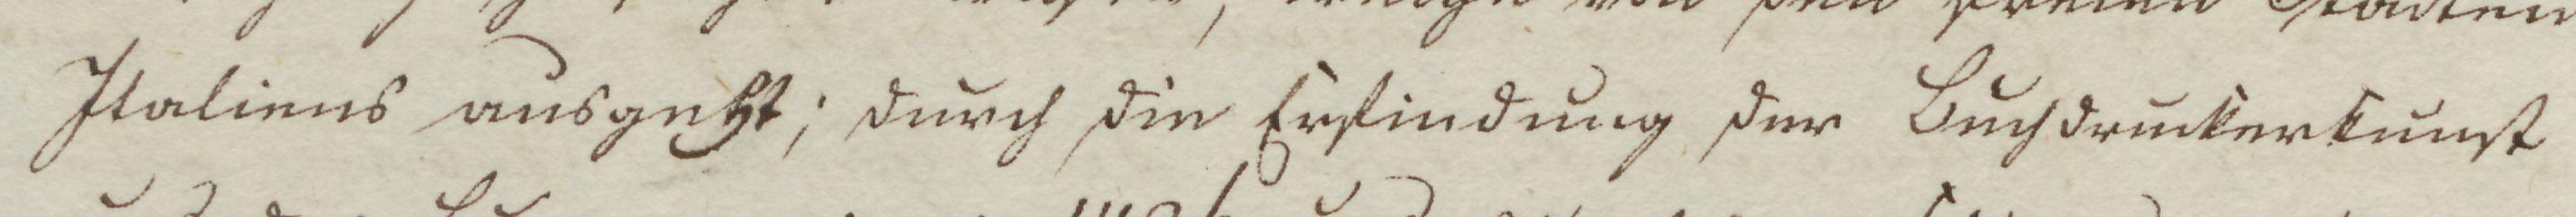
Italiens ausgetht; durch die Erfindung der Buchdruckerkunst
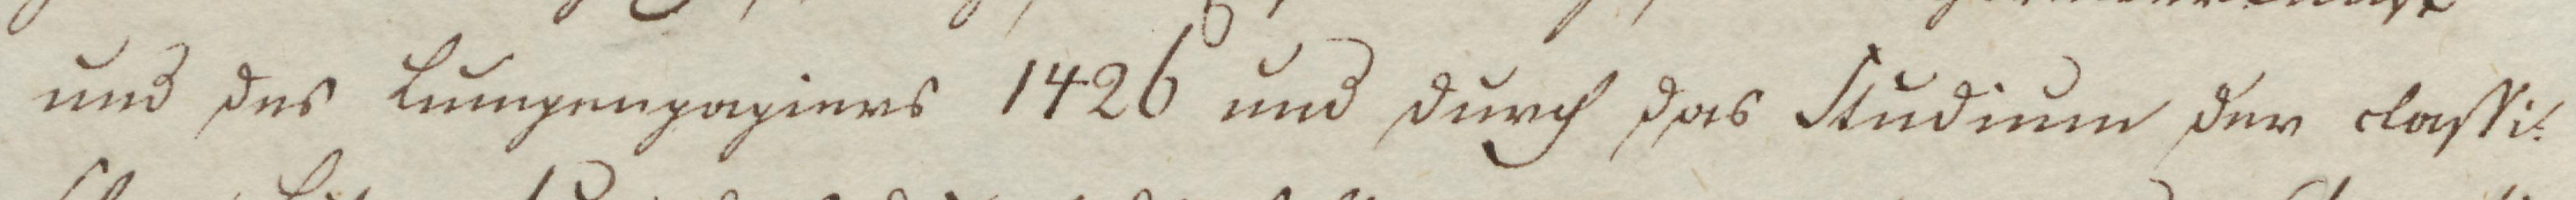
und des Lumpenpapiers 1426 und durch das Studium der classi-
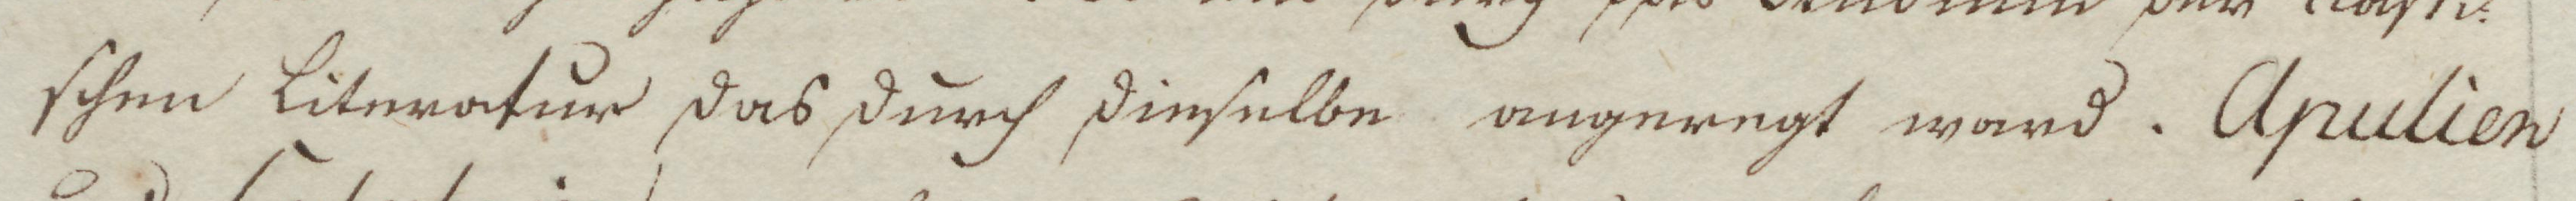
schen Literatur das durch dieselbe angeregt ward. Apulien
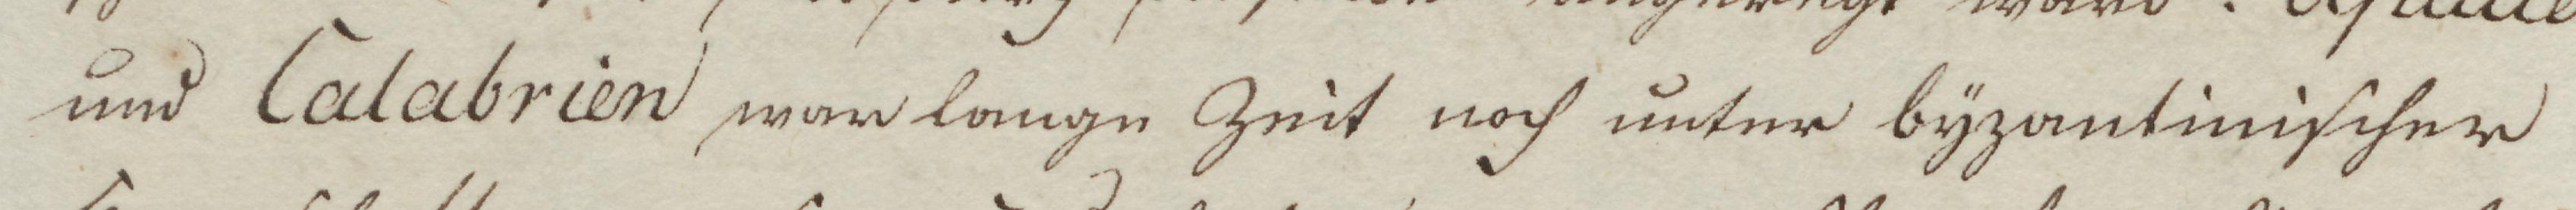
und Calabrien war lange Zeit noch unter bÿzantinischer
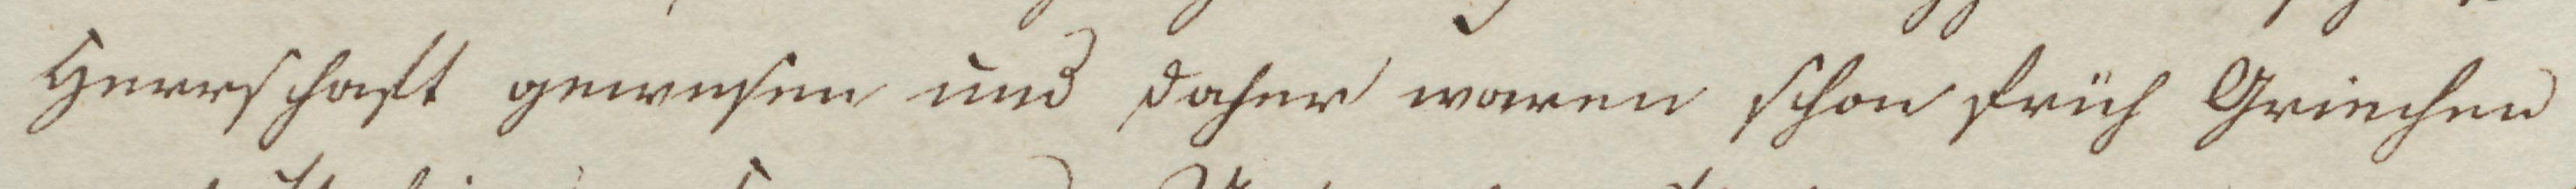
Herrschaft gewesen und daher waren schon früh Griechen
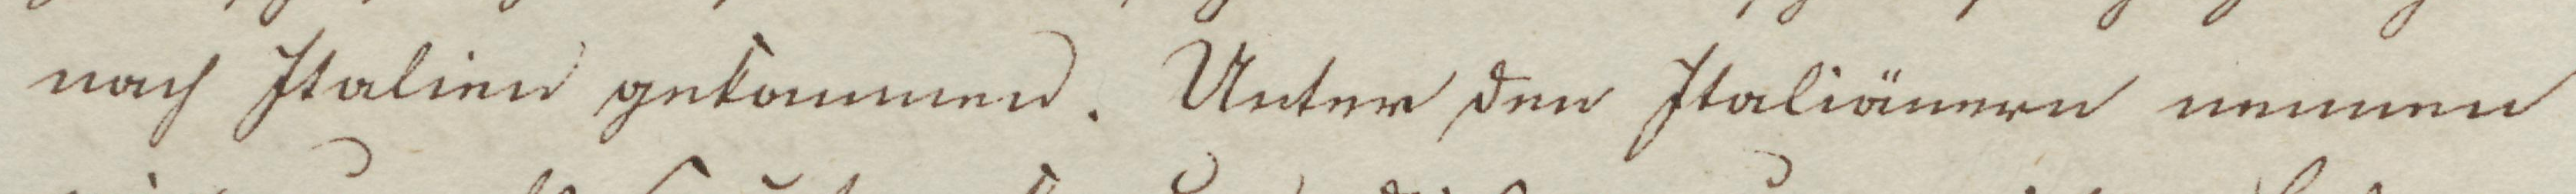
nach Italien gekommen. Unter den Italiänern nennen
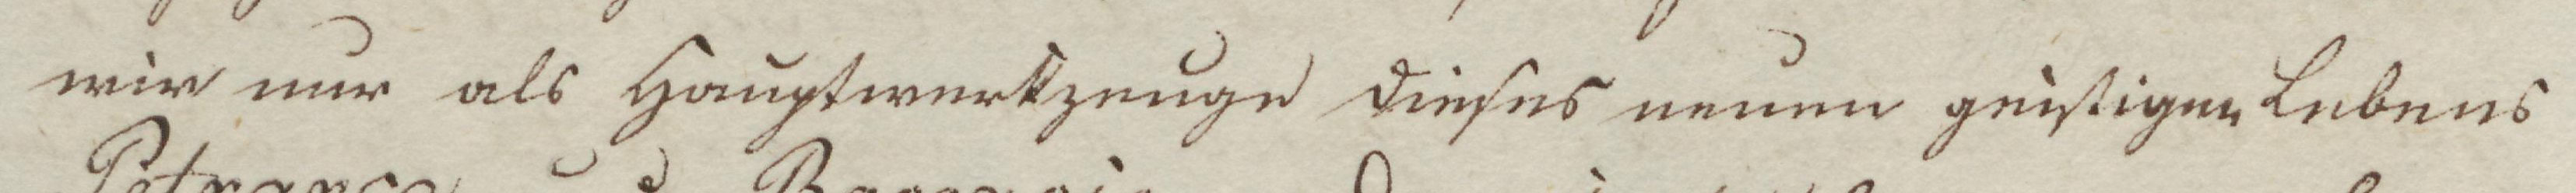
wir nur als Hauptwerkzeuge dieses neuen geistigen Lebens
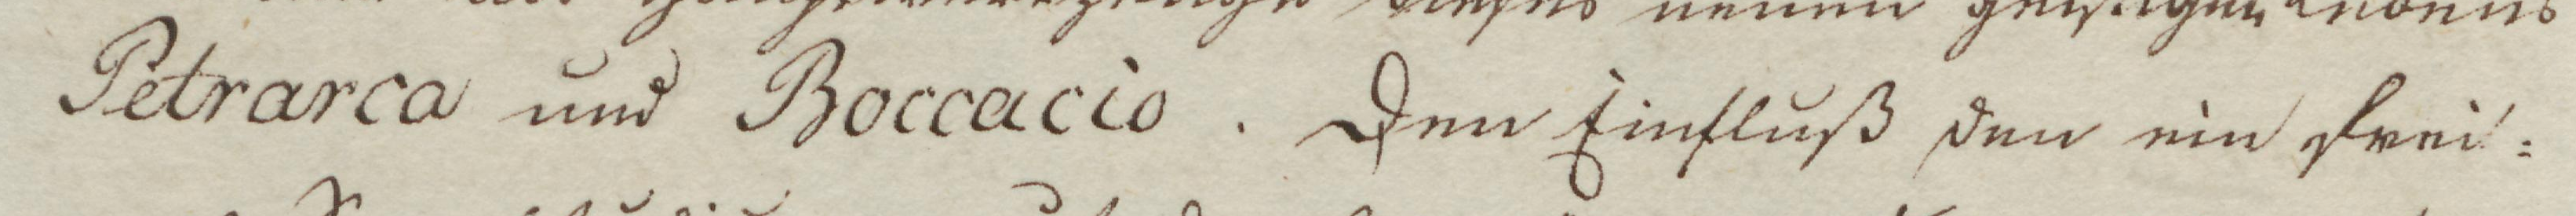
Petrarca und Boccacio. Den Einfluß den ein frei-
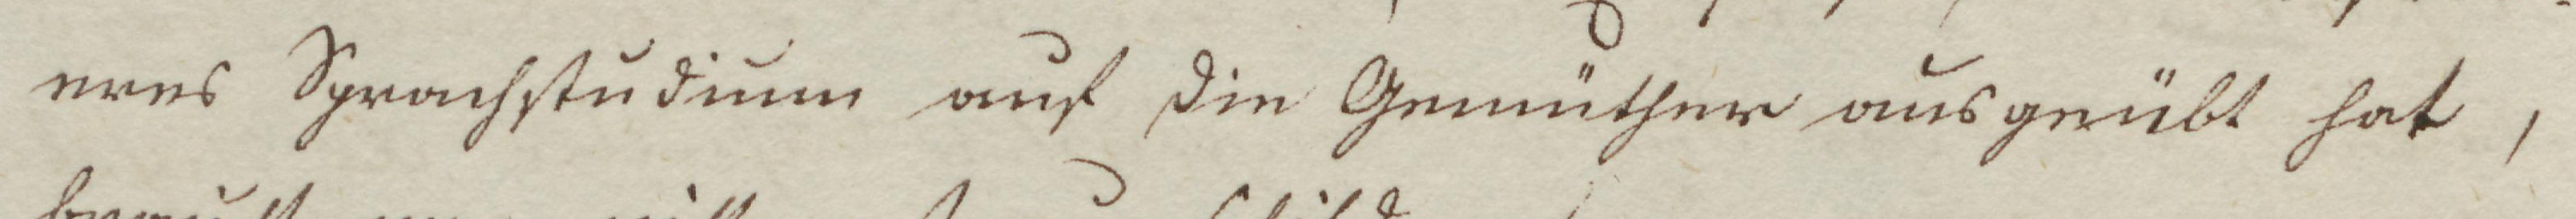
eres Sprachstudium auf die Gemüther ausgeübt hat,
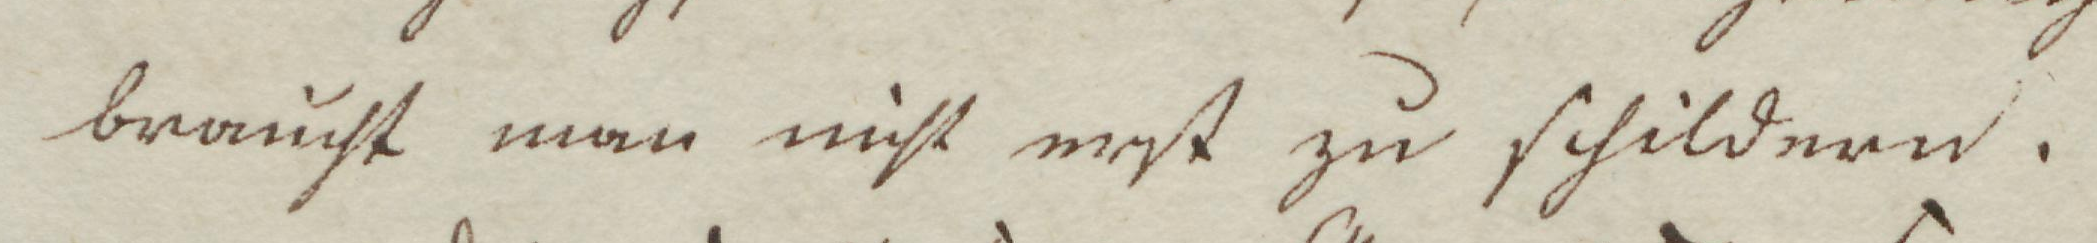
braucht man nicht erst zu schildern.
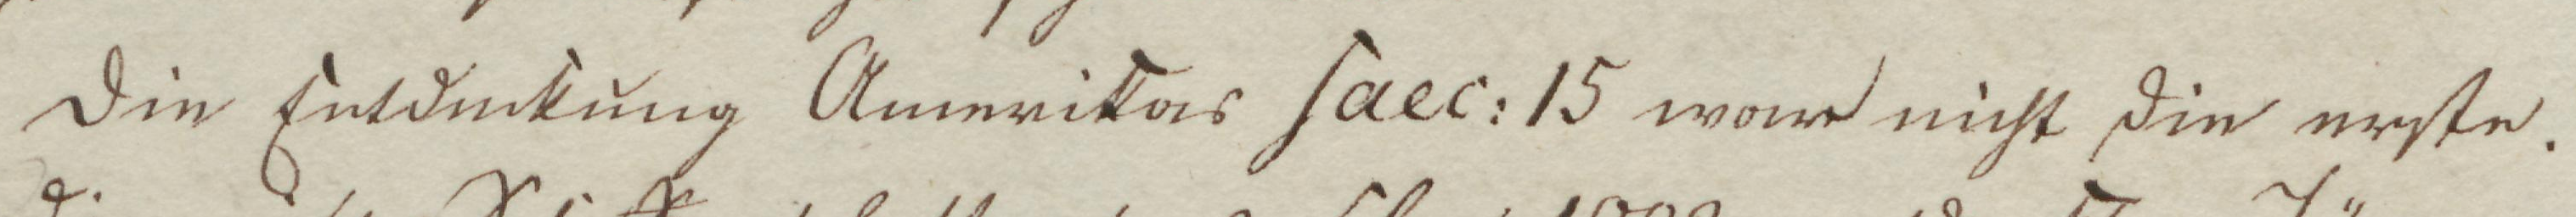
Die Entdeckung Amerikas saec: 15 war nicht die erste.
